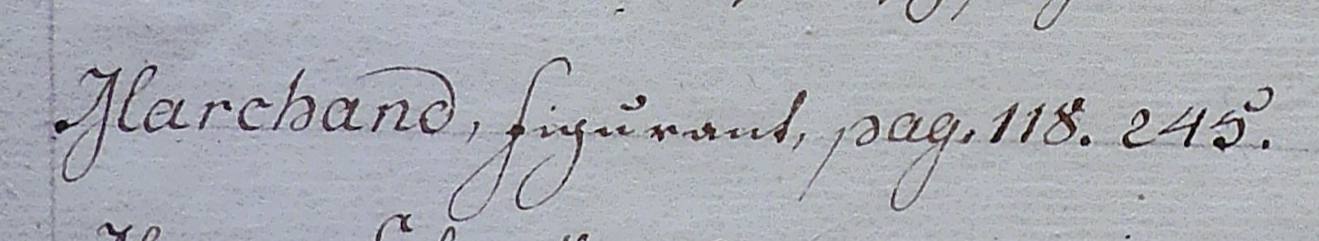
Marchand, Figurant, pag. 118. 245.
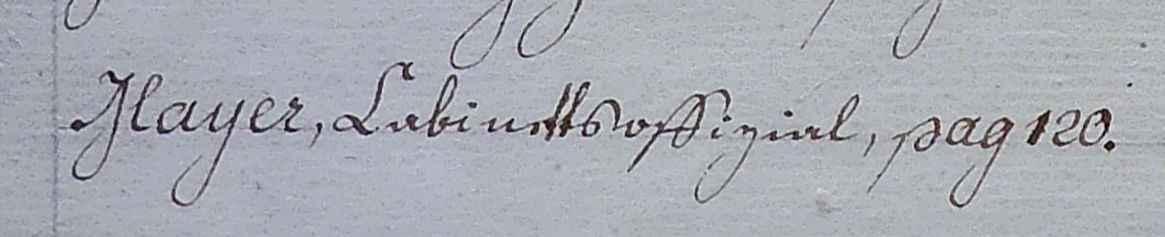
Mayer, Cabinettsoffizial, pag 120.
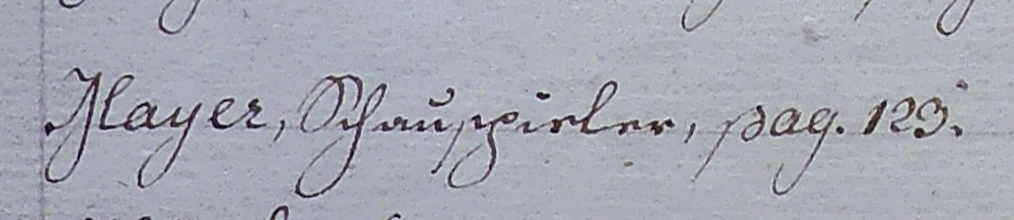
Mayer, Schauspieler, pag. 123.
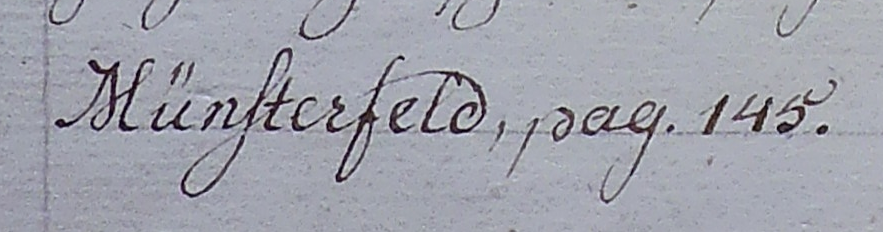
Münsterfeld, pag. 145.
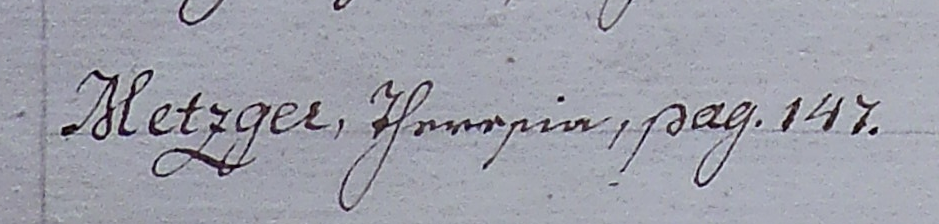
Metzger, Theresia, pag. 147.
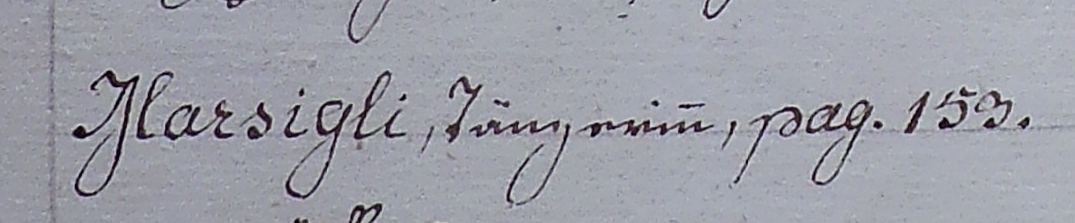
Marsigli, Tänzerin̅, pag. 153.
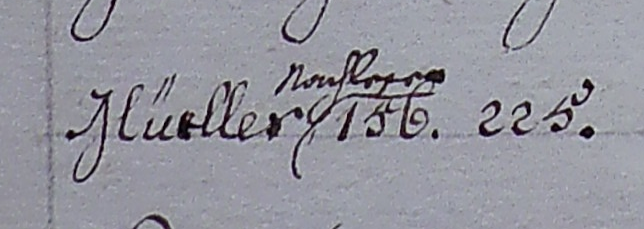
MüellerNachleser, 156. 225.
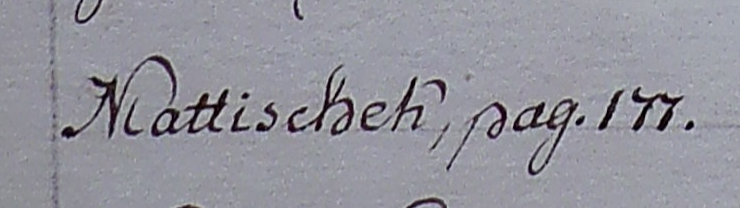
Mattischek, pag. 177.
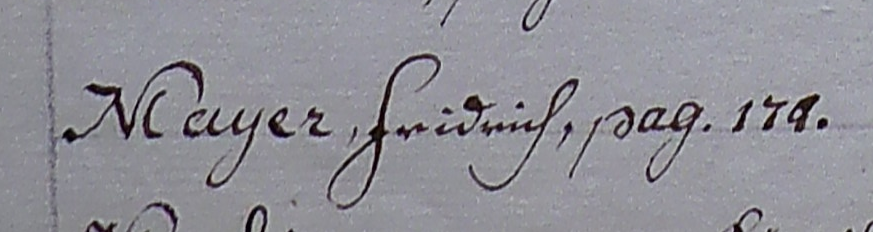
Mayer, Fridrich, pag. 179.
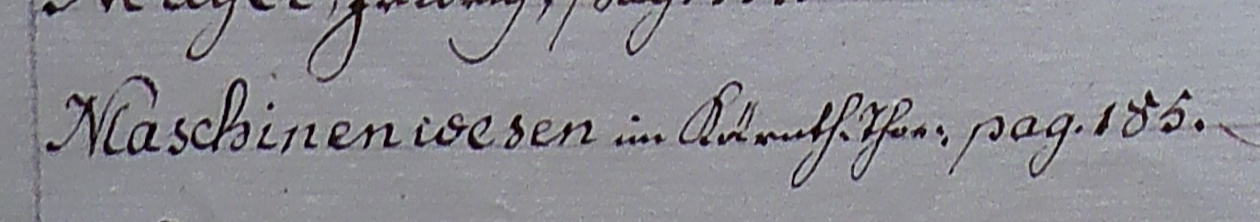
Maschinenwesen im Kärnth. Thor: pag. 185.
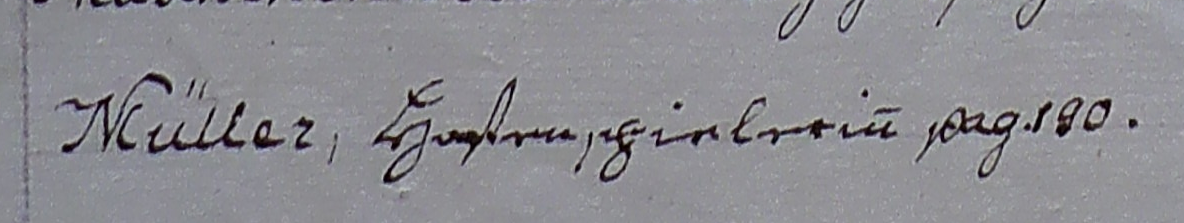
Müller, Harfenspielerin̅ pag. 190.
